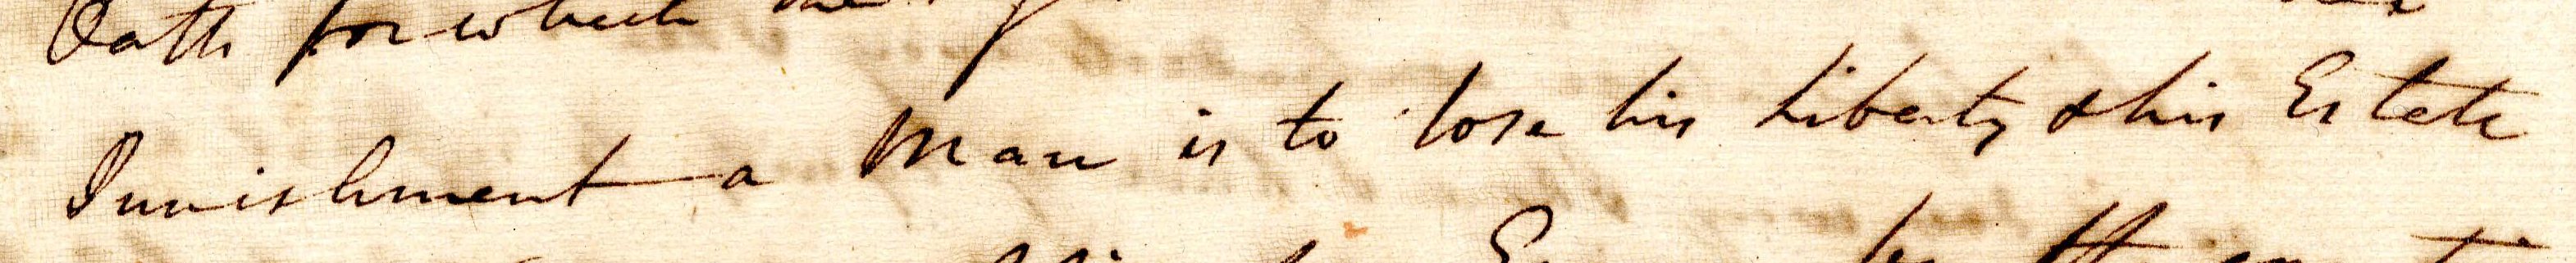Punishment a Man is to lose his Liberty & his Estate
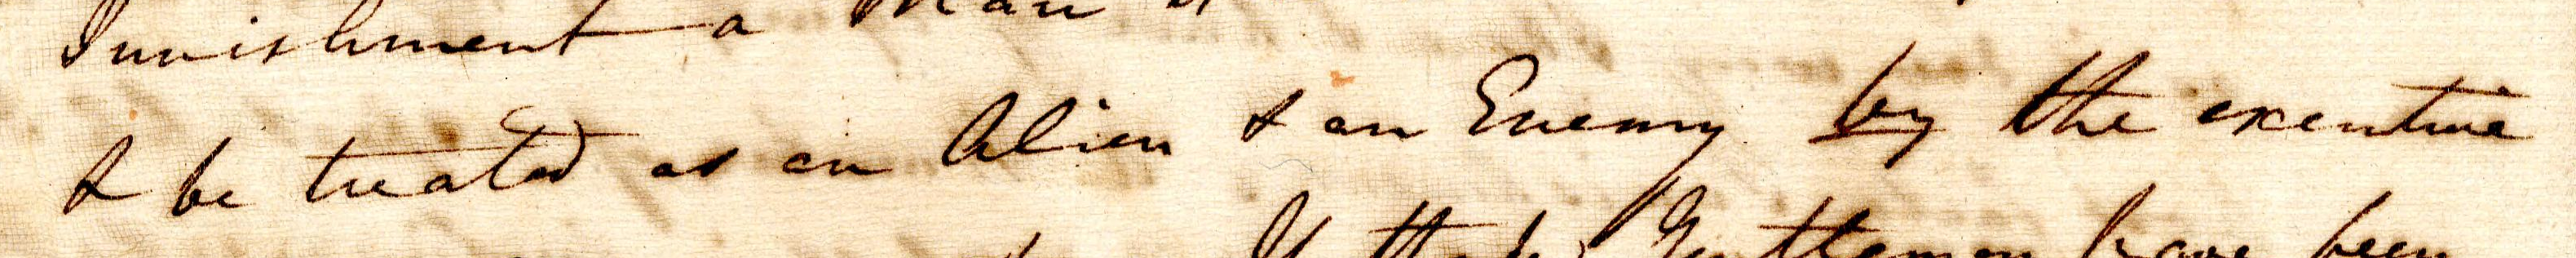& be treated as an Alien & an Enemy by the executive
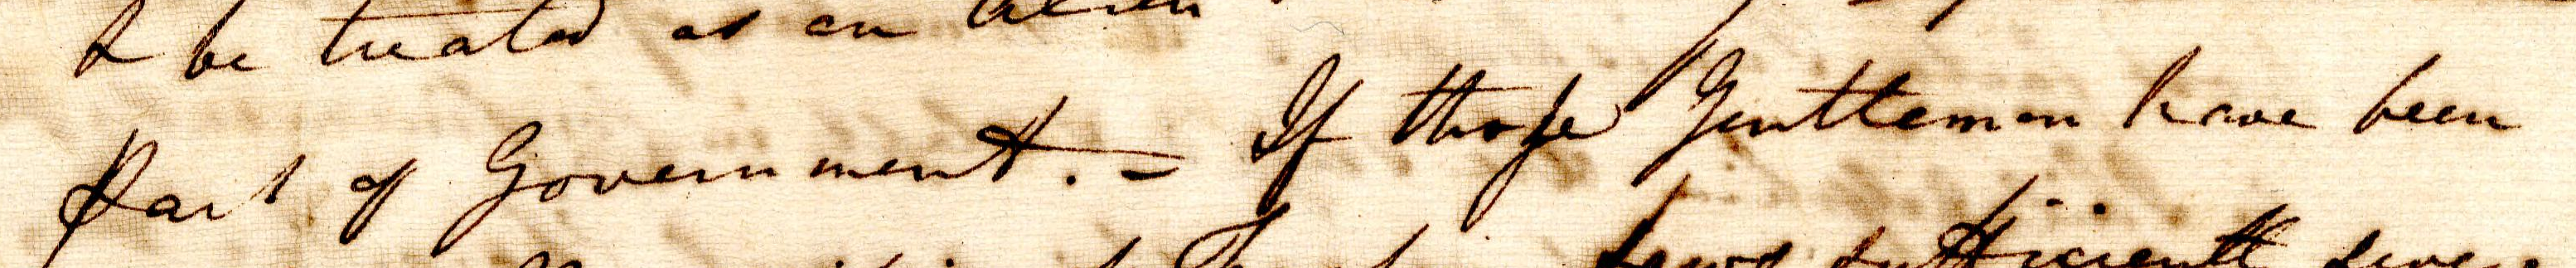Part of Government.- If those Gentlemen have been
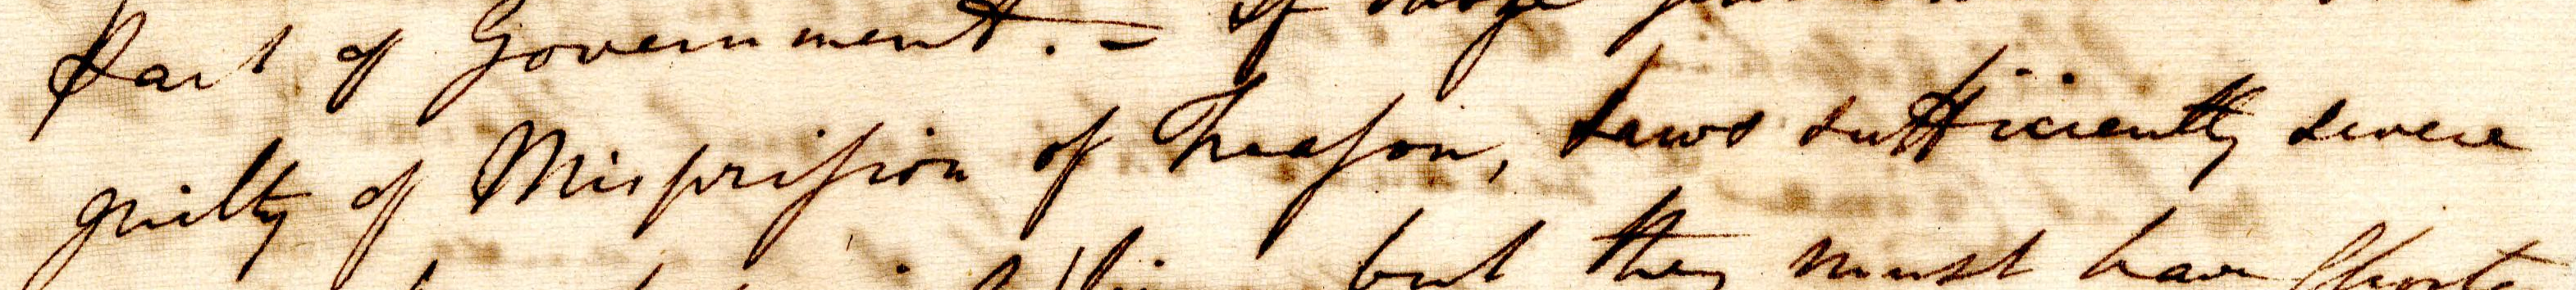guilty of Misprision of Treason, Laws sufficiently severe
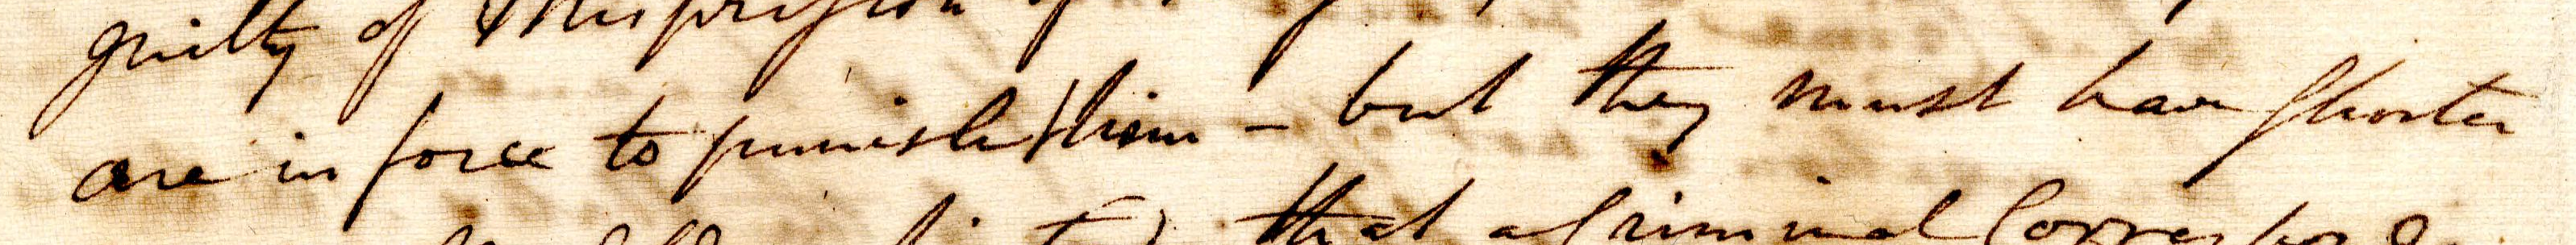are in force to punish them- but they must have shorter
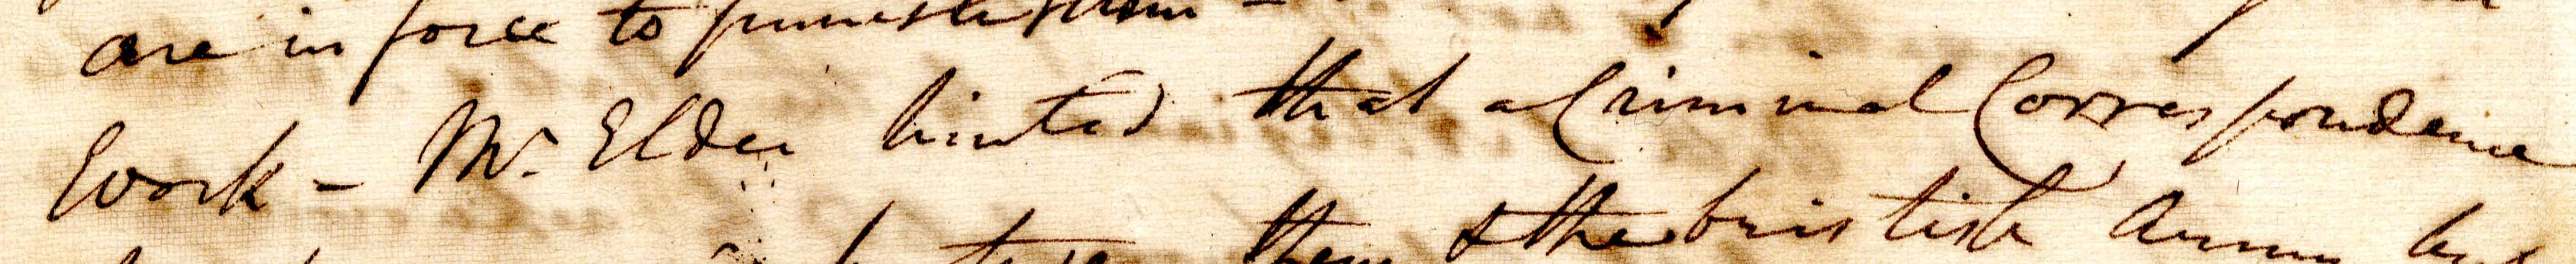Work- M^r. Elder hinted that a Criminal Correspondence
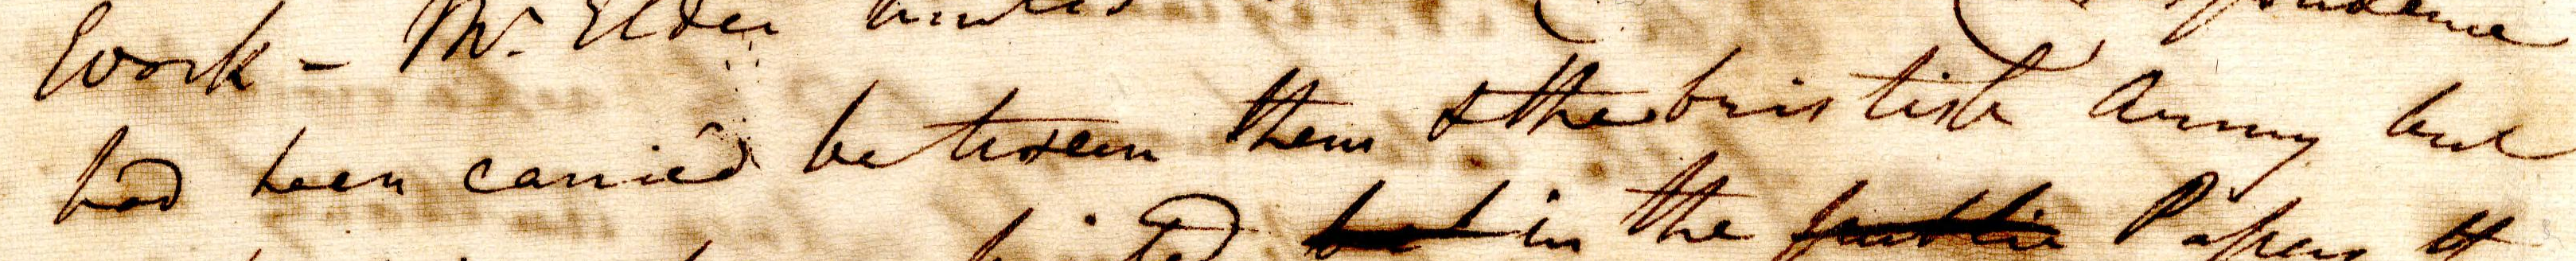had been carried between them & the british Army but
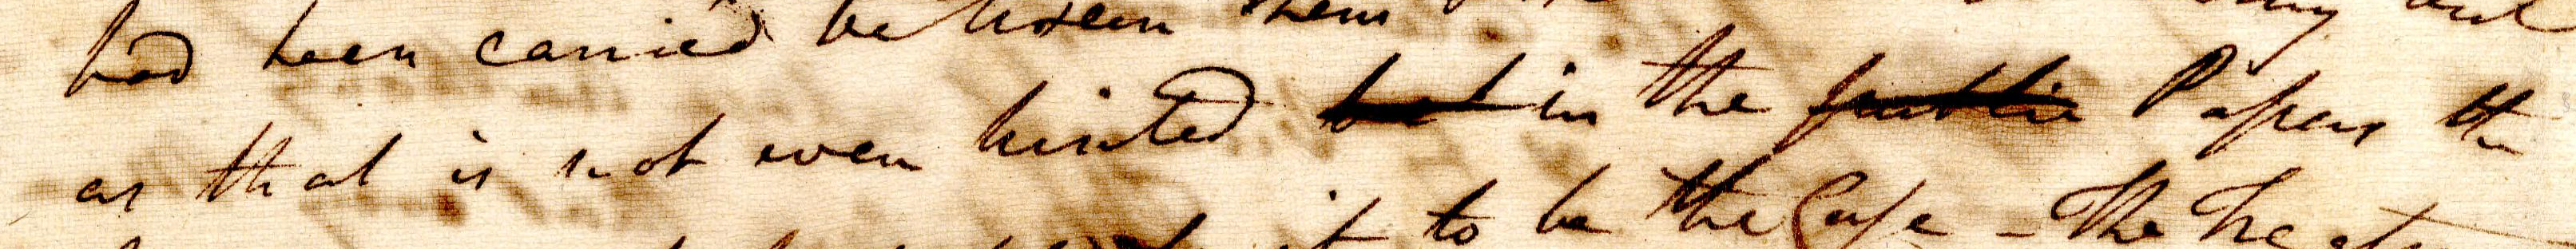as that is not even hinted but in the public Papers the
